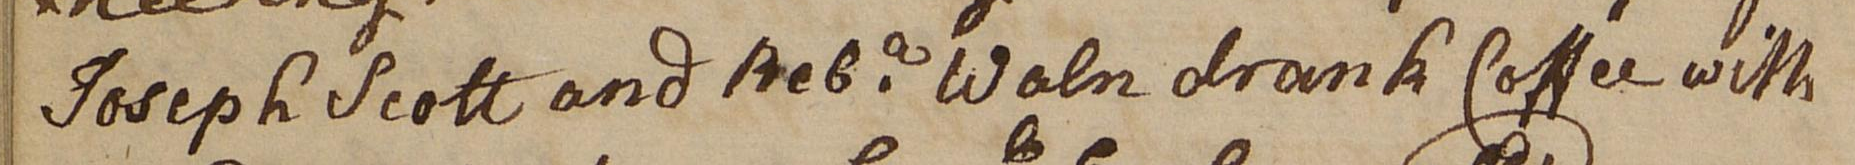Joseph Scott and Reb^a. Waln drank Coffee with
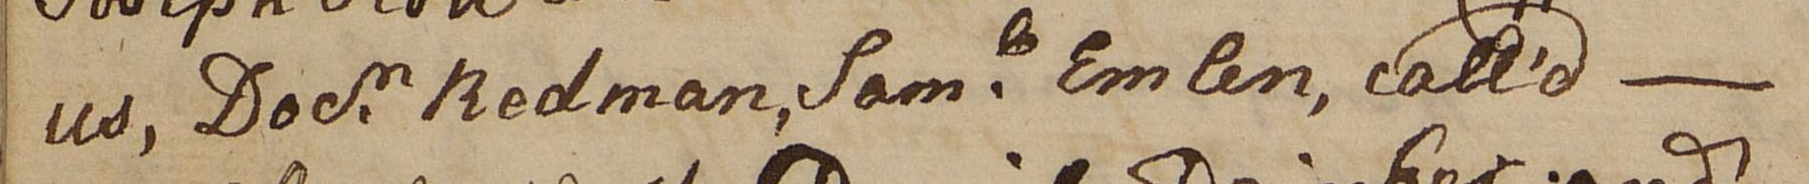us, Doc^r. Redman, Sam^l. Emlen, call'd-
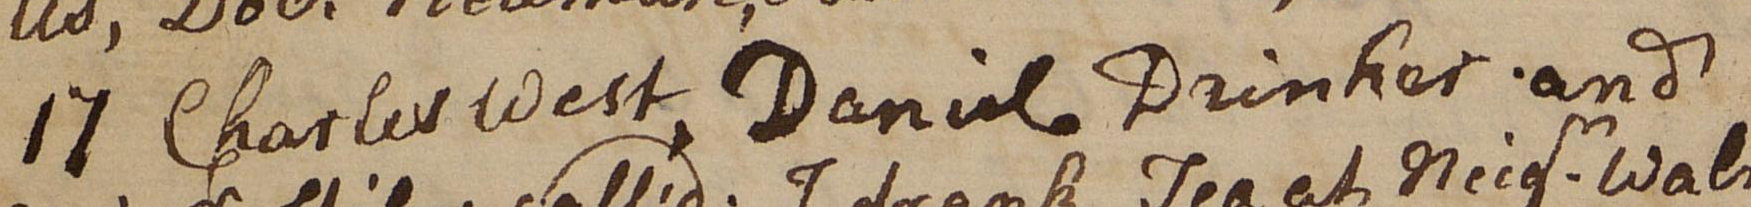17 Charles West, Daniel Drinker and
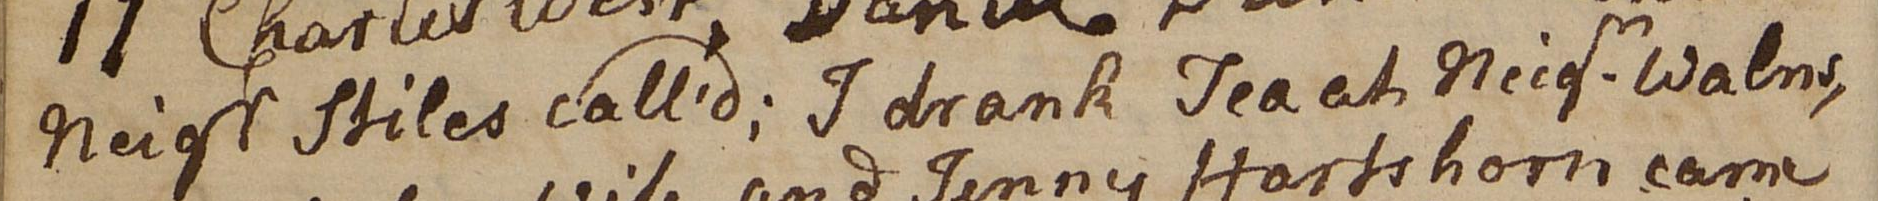Neig^r. Stiles call'd; I drank Tea at Neig^r. Walns,
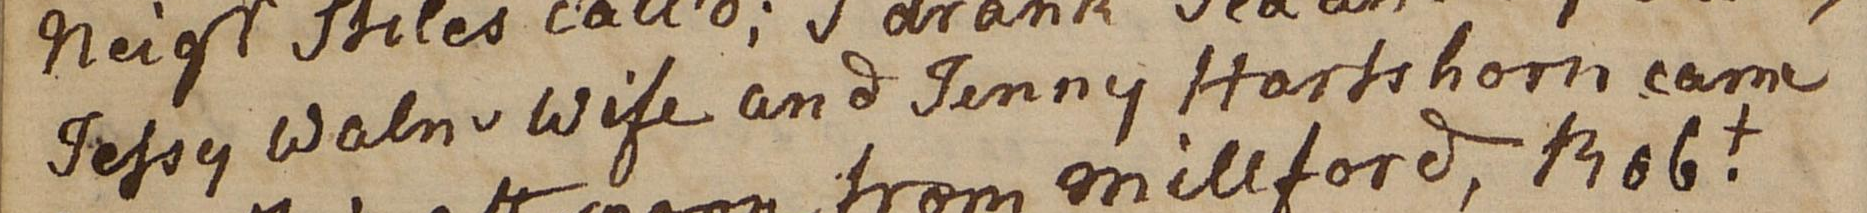Jessy Walns Wife and Jenny Hartshorn came
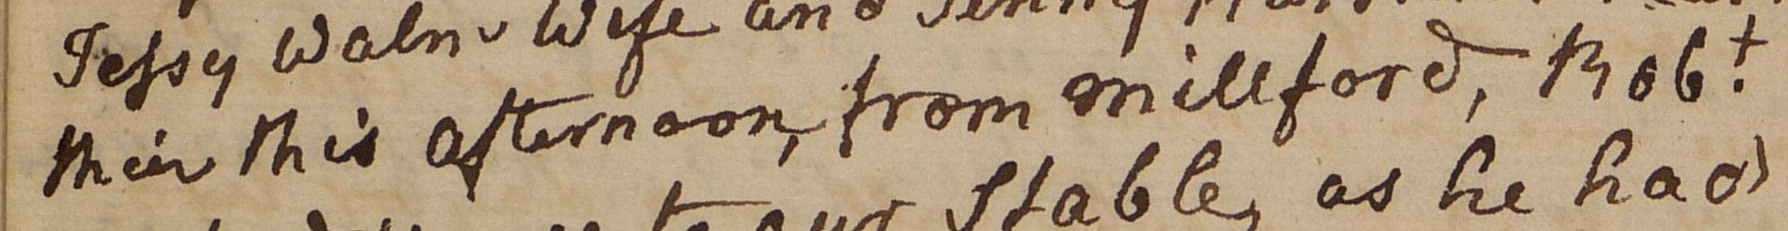their this afternoon from Millford, Rob^t.
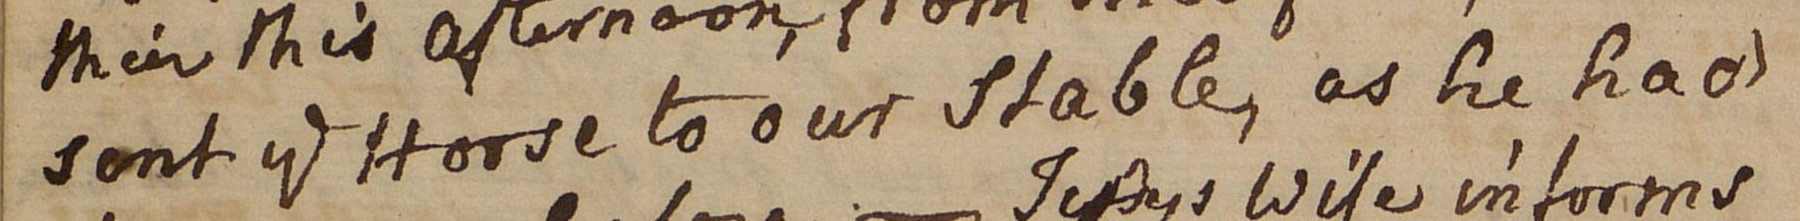sent y^e Horse to our Stable, as he had
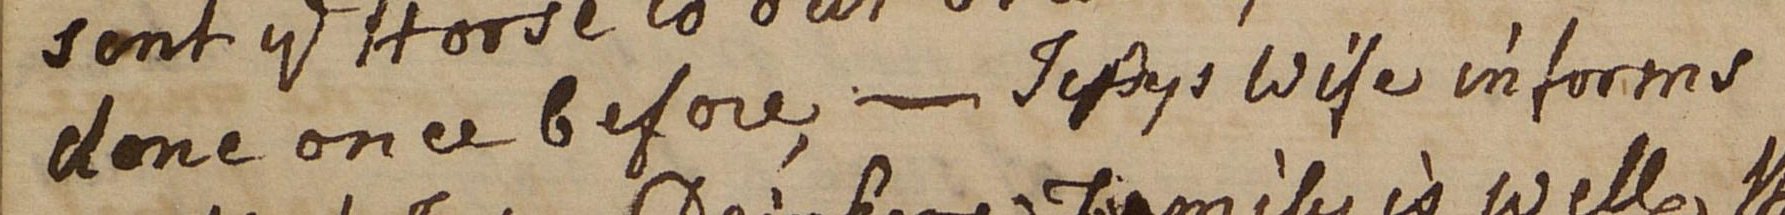done once before,- Jessys wife informs
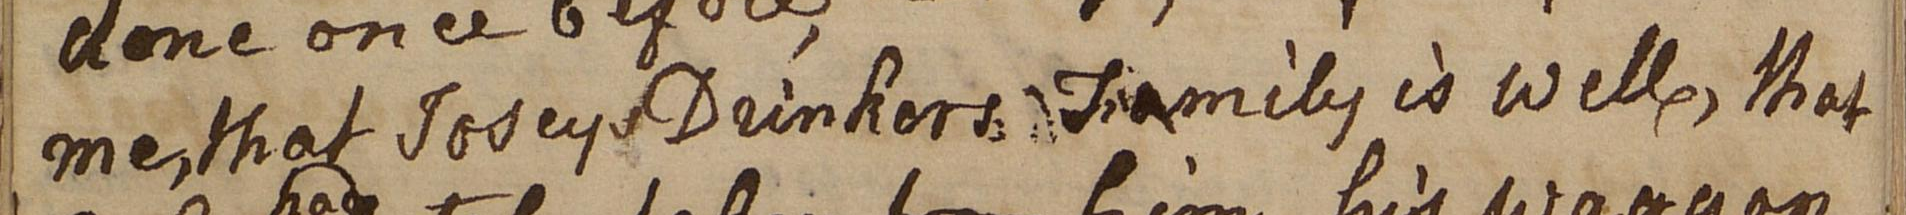me, that Josey Drinkers Family is well, that
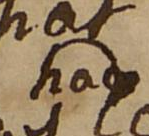had
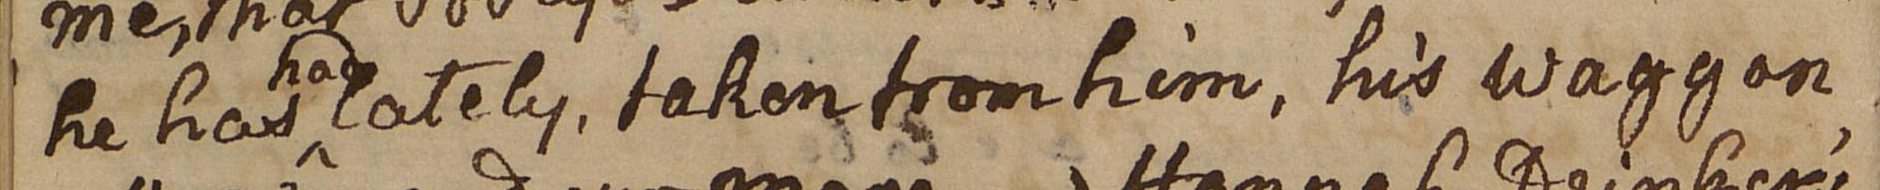he has ^ lately, taken from him, his waggon,
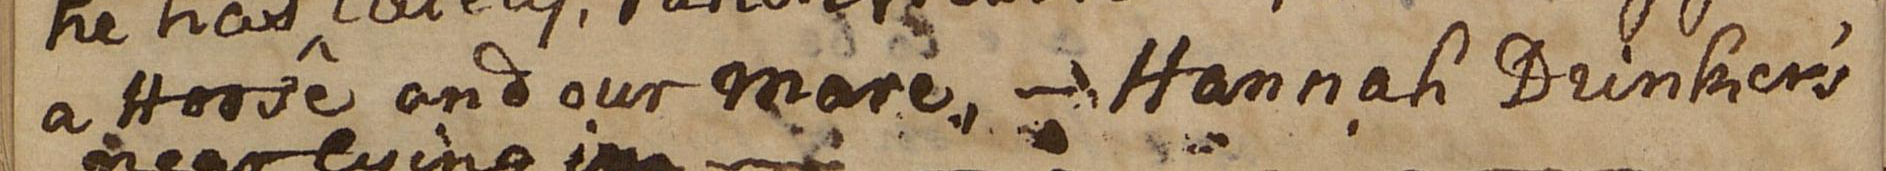a Horse and our mare,- Hannah Drinker's
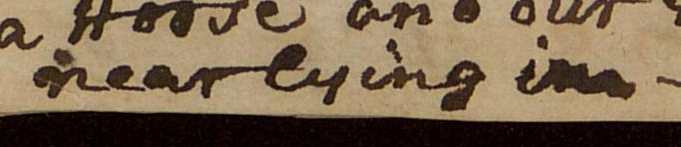near lying in-
